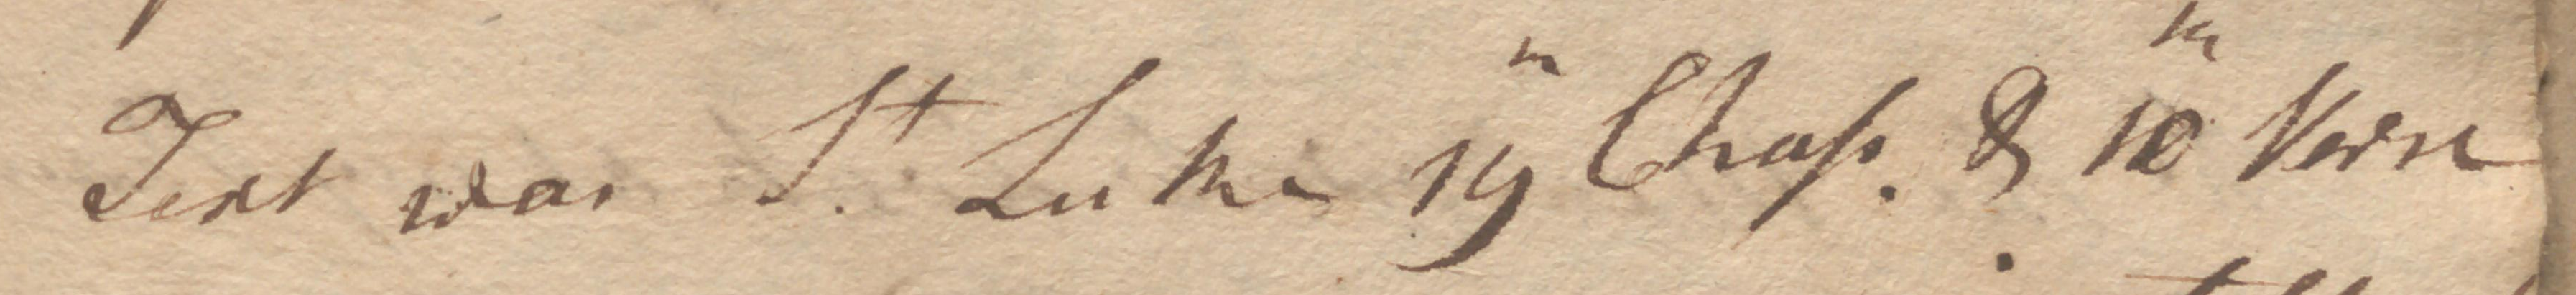Text was S^t. Luke 19^th Chap. & 10^th Verse
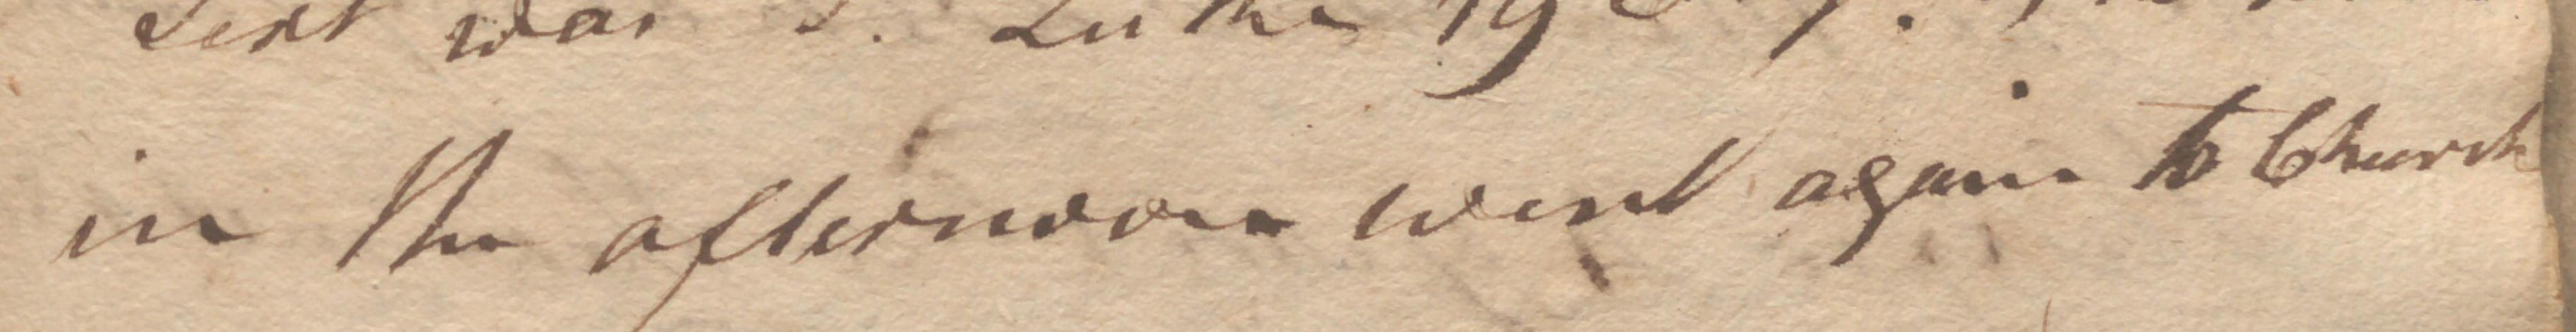in the afternoon went again to Church
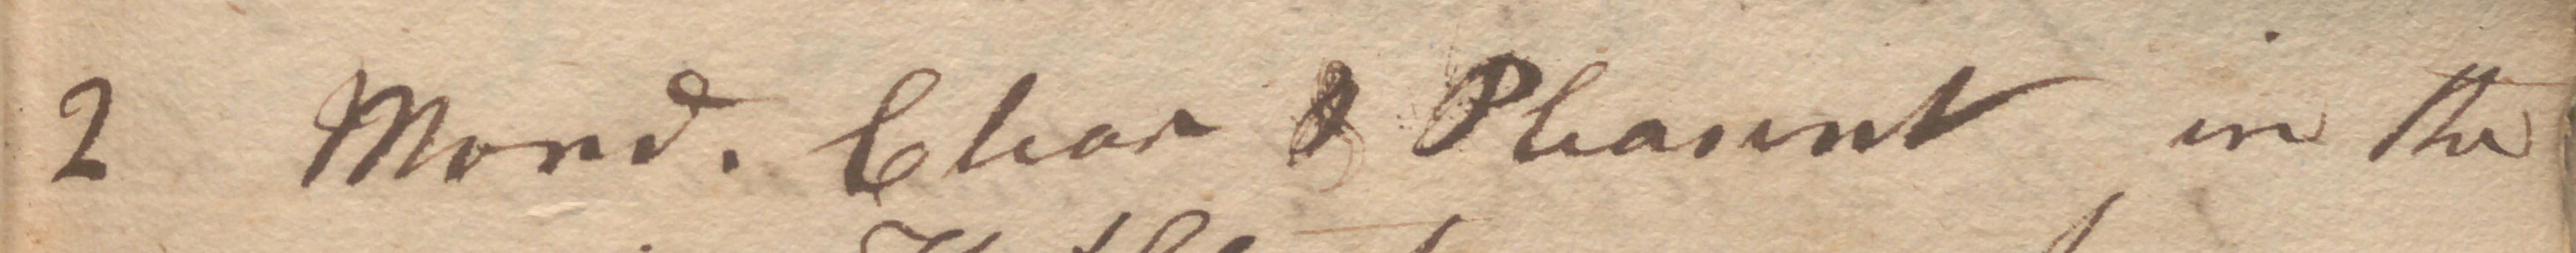2 Mond. Clear & Pleasent in the
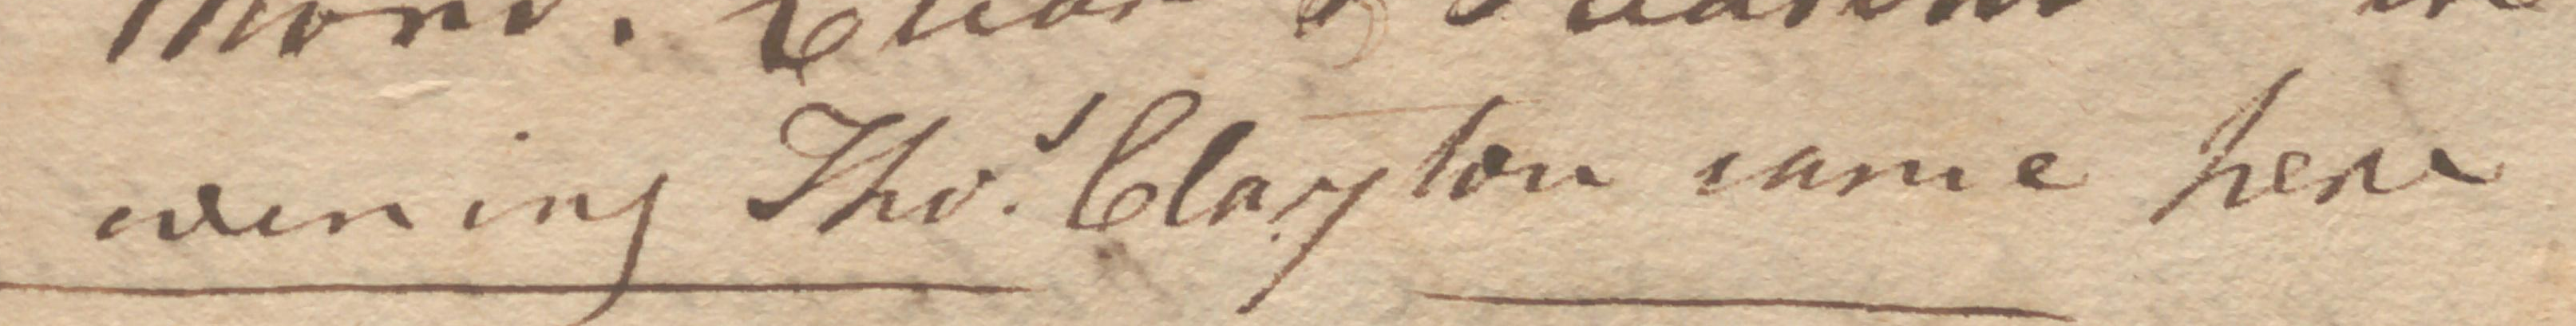evening Tho^s. Clayton came here
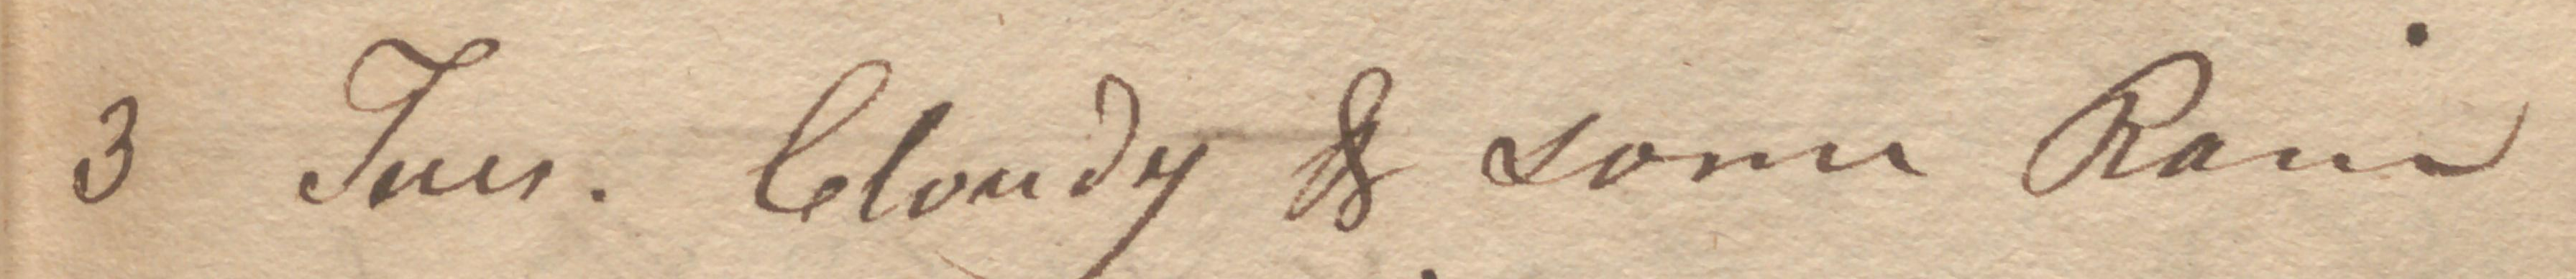3 Tues. Cloudy & some Rain
